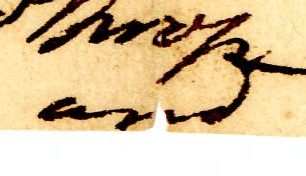and
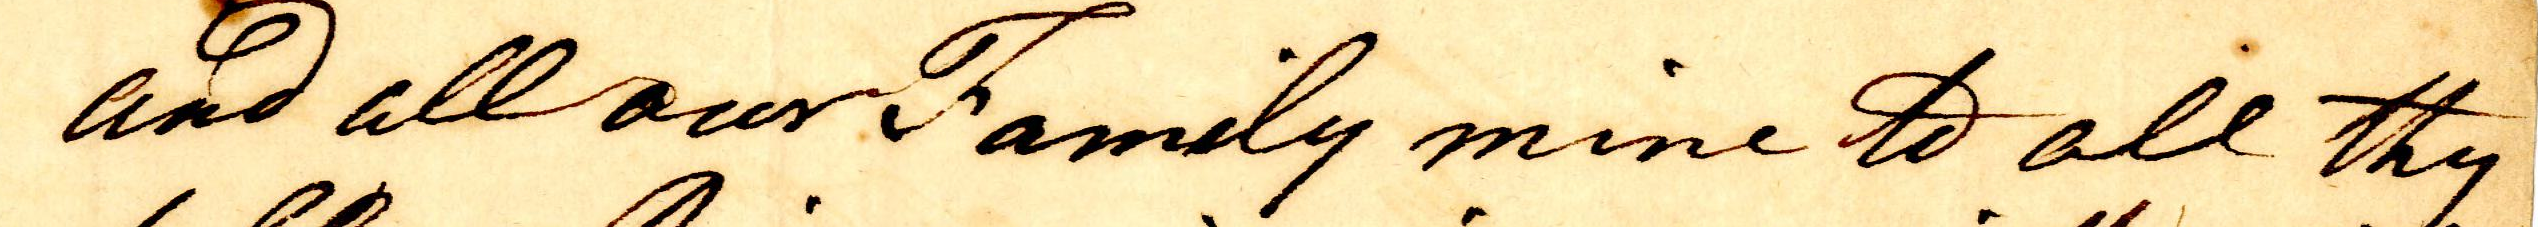and all our Family mine to all thy
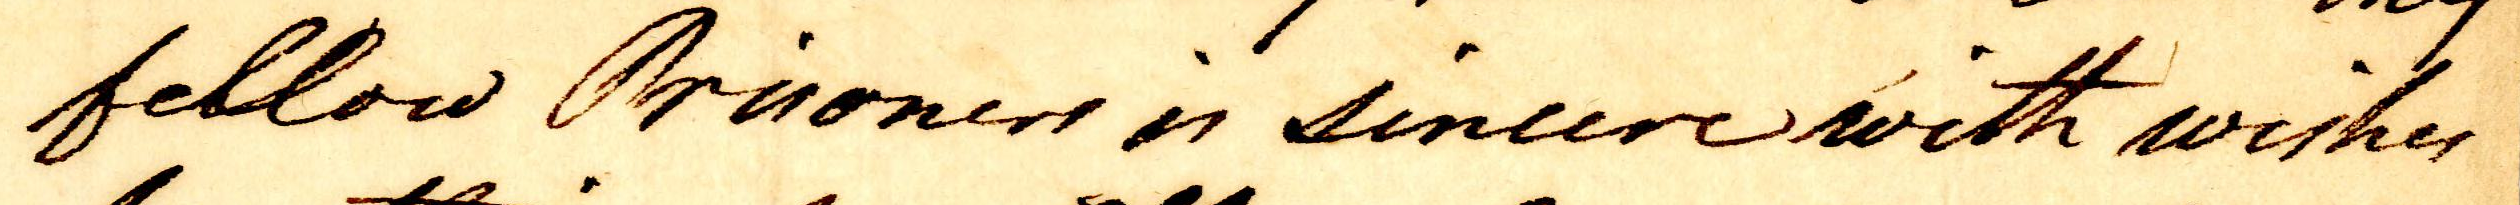fellow Prisoners in sincere with wishes
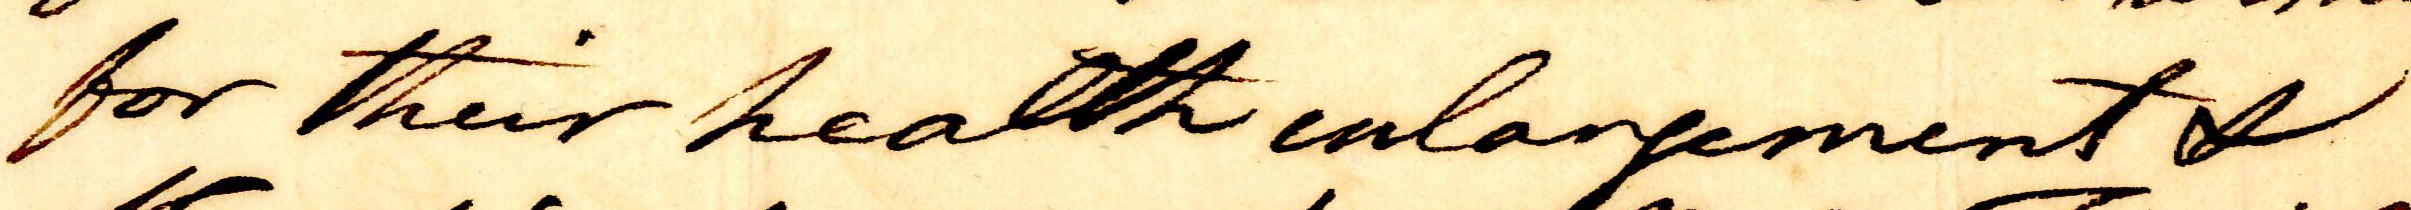for their health enlargement &
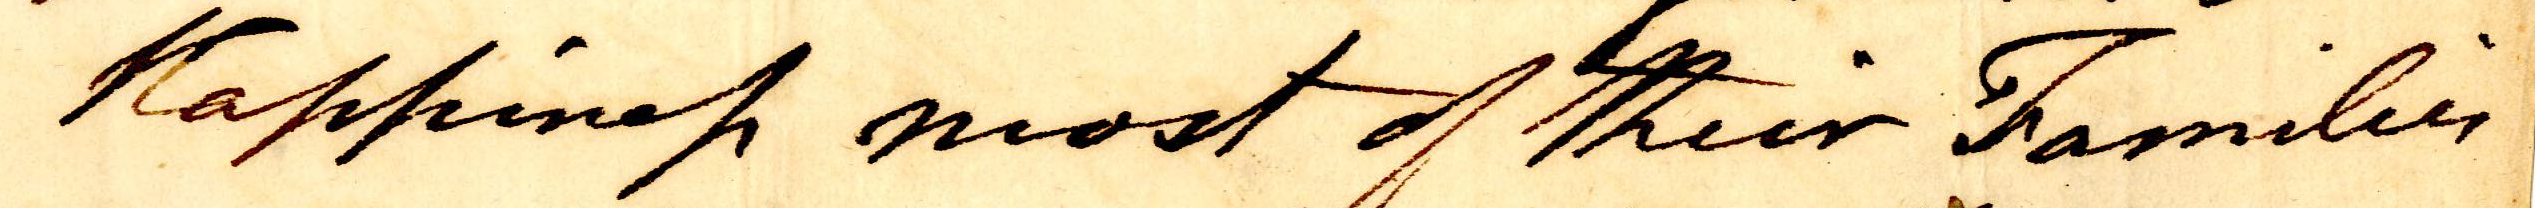Happiness most of their Families
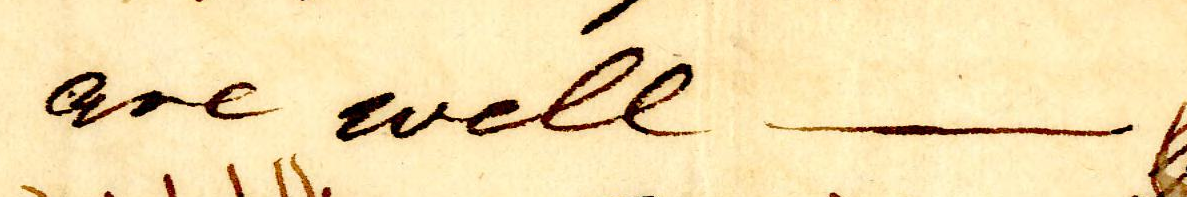are well-
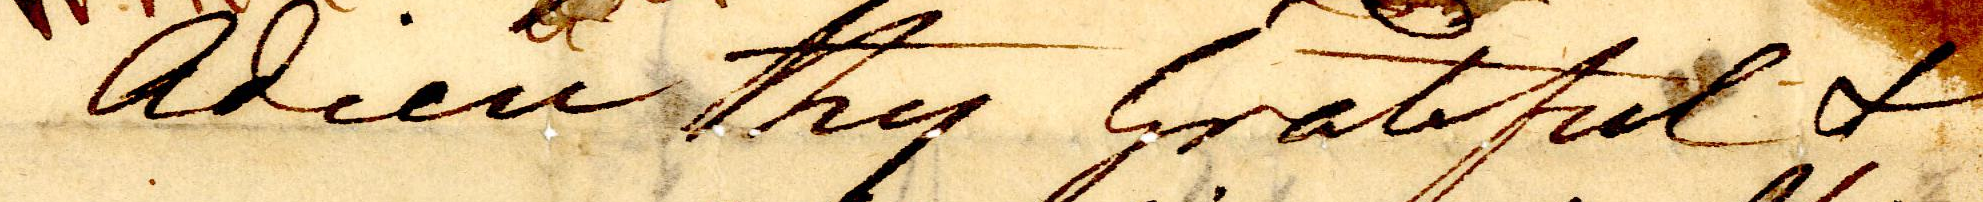Adieu thy Grateful &
